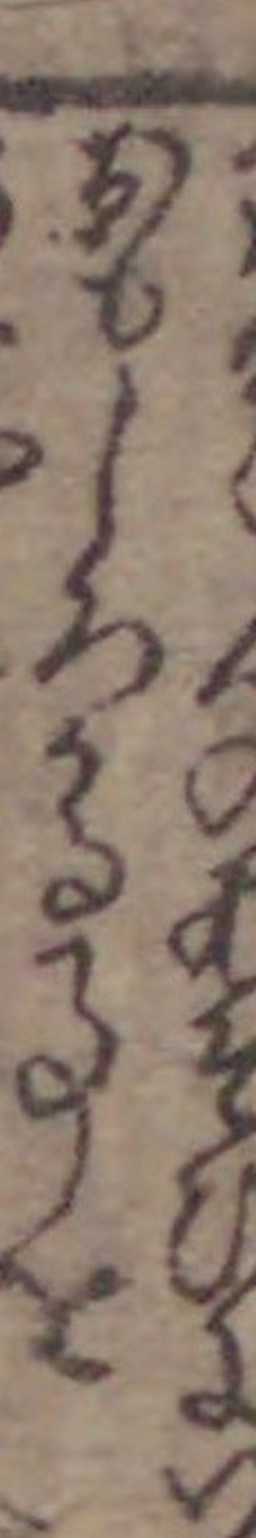おもしろかる事を
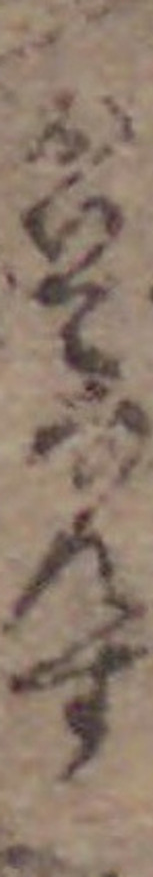おいてなんす
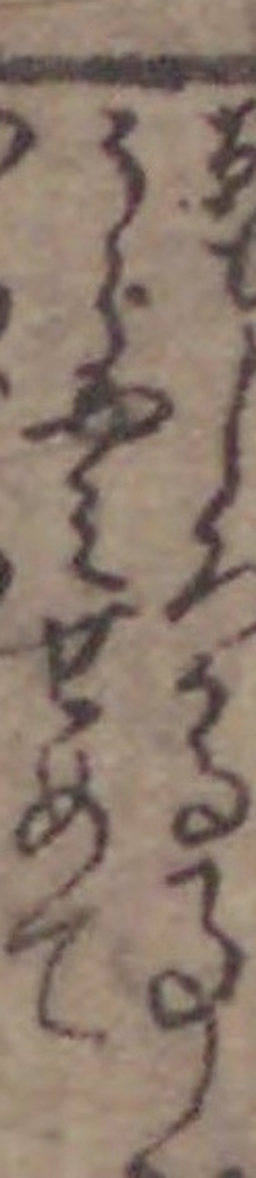うらやみせめて
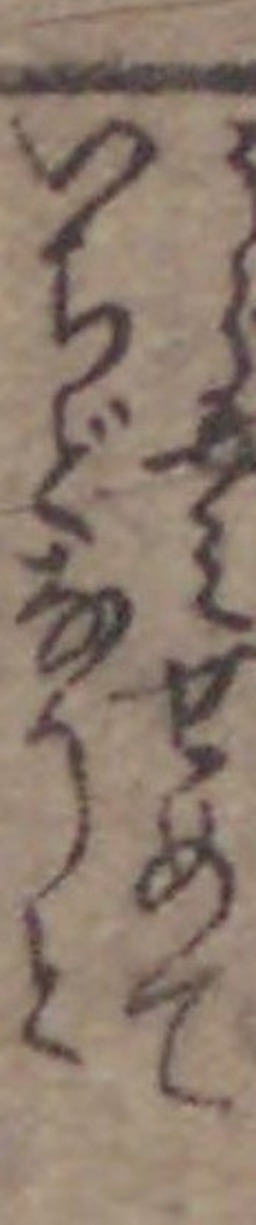いちどなりと
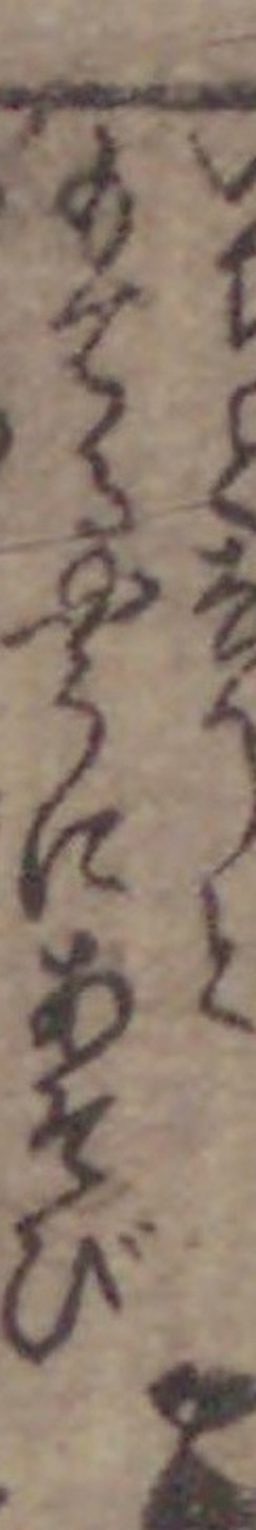もてるやうにあそび
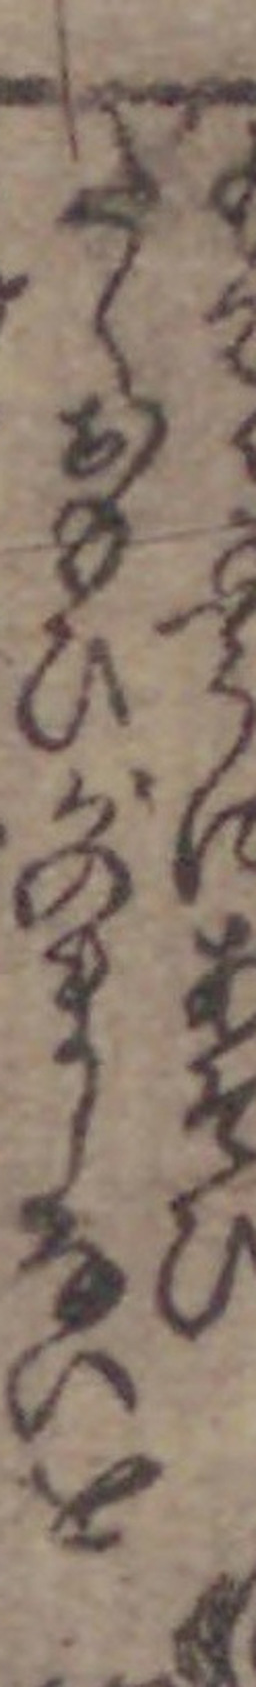たくおもひかのましないを
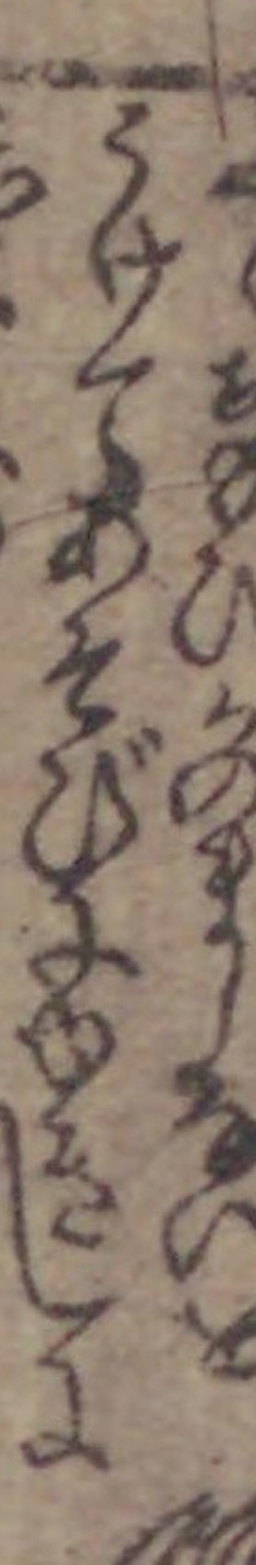うけてあそびにゆきしに
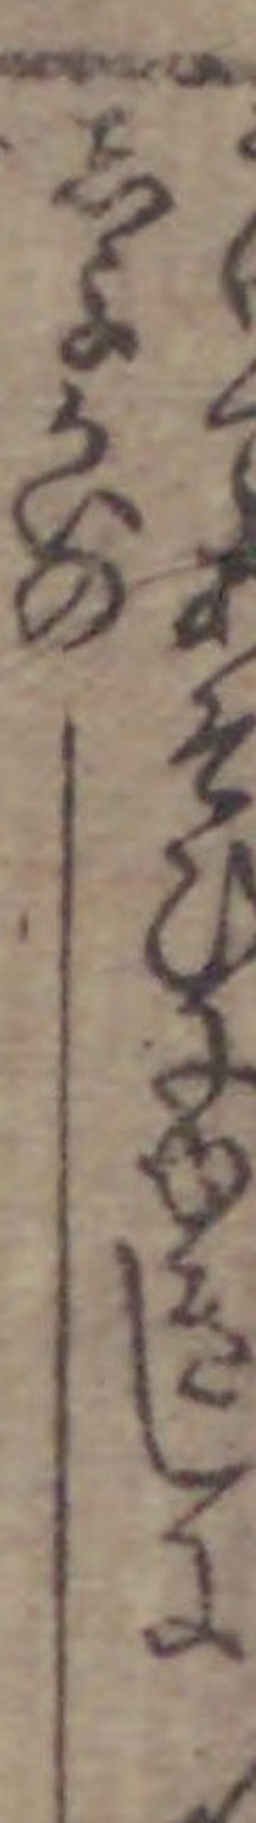しよかいの
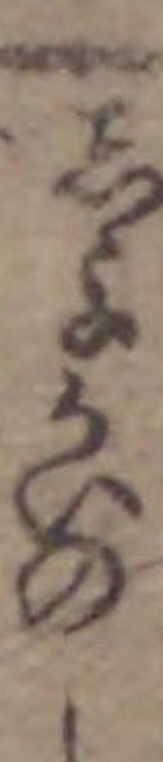しよかいの
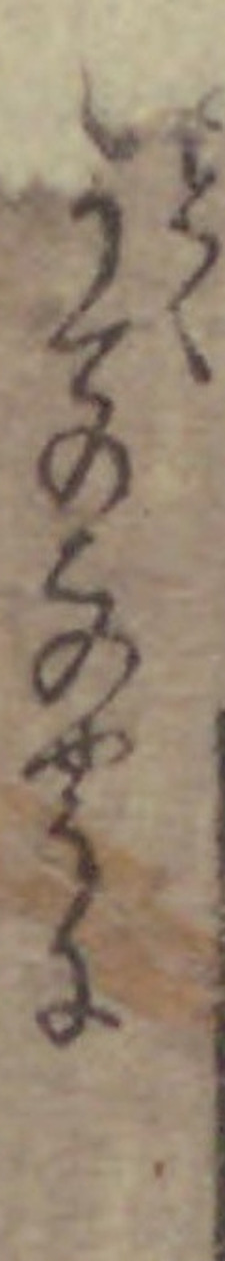てのこのやうに
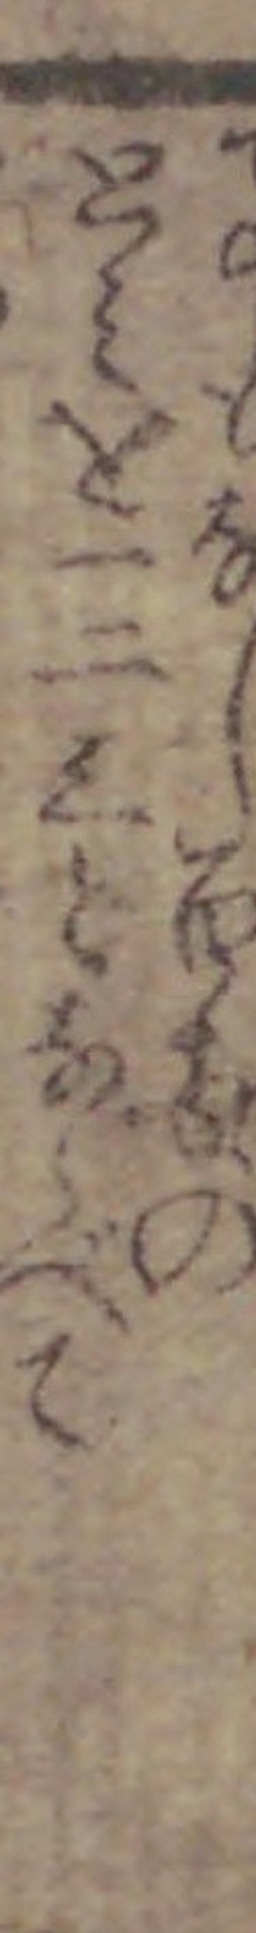とみを一二三とならべて
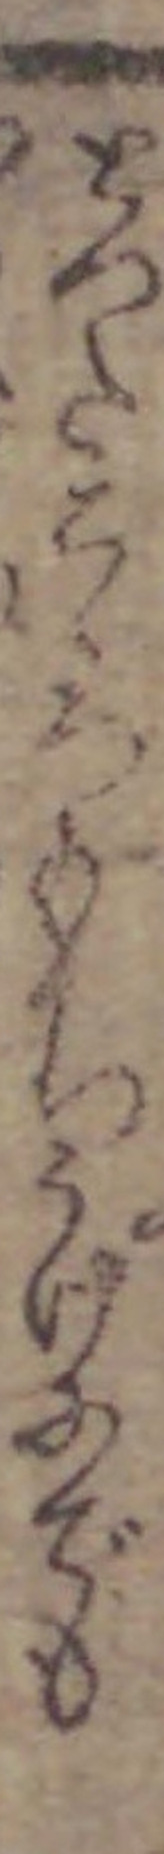とつたこゝろもちうけにでも
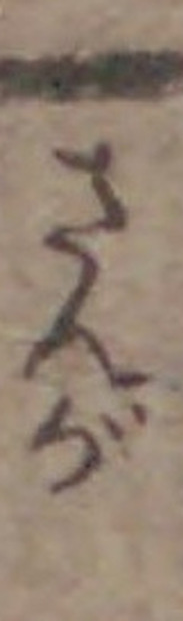さんが
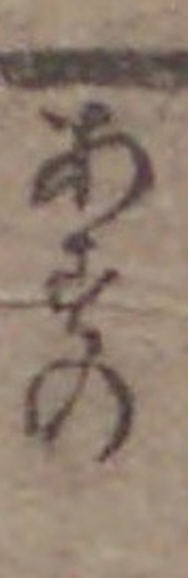あすの
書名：御代の御寶
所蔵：国立国会図書館 National Diet Library, JAPAN
